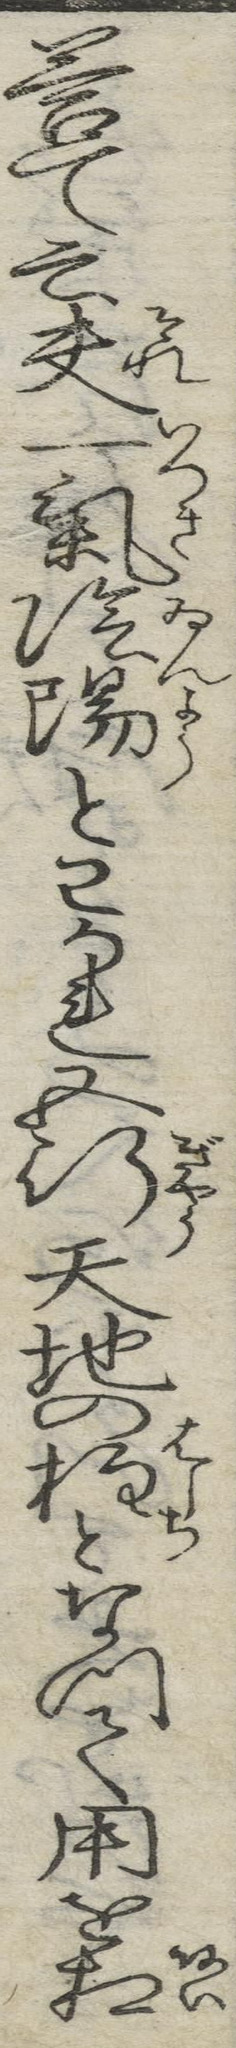答て云夫一気陰陽とわかれ五行天地の柱となつて用を相
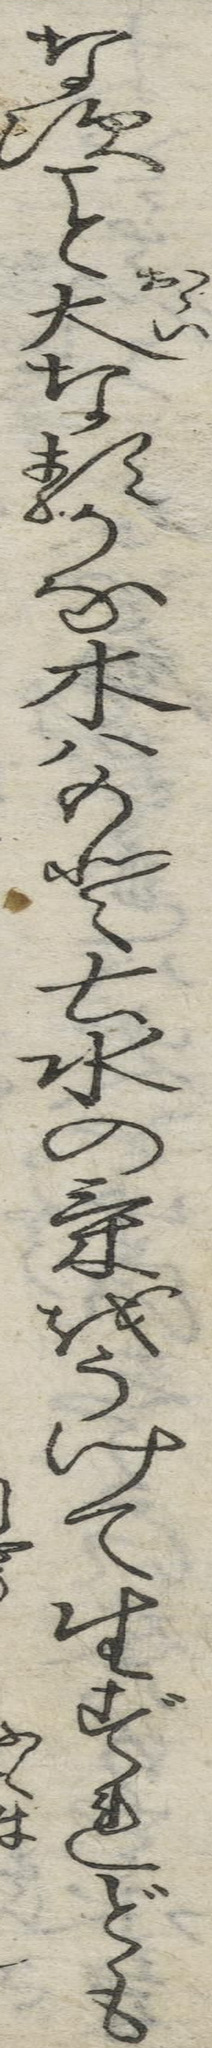なすこと大なるかな木はもと土水の気をうけて生ずれども
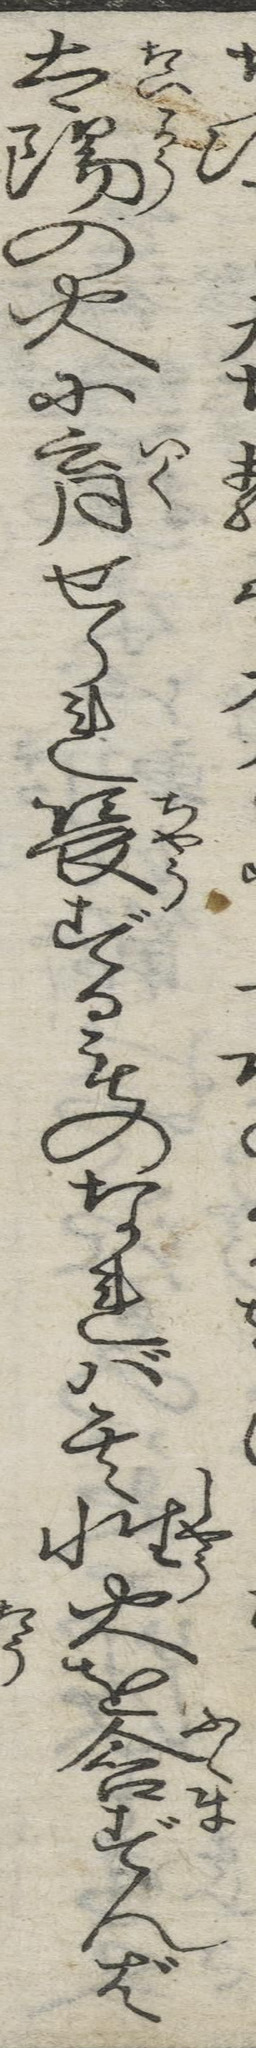太陽の火に育せられ長ずるものなれば性火を含ずんば
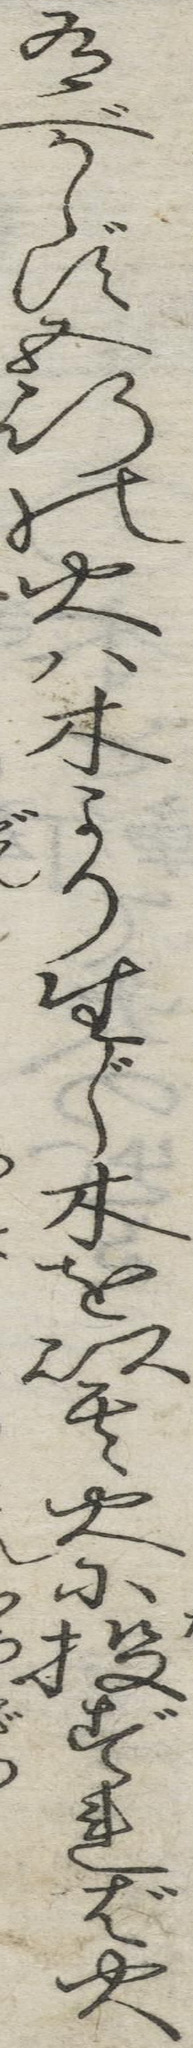有べからず五行の火は木より生じ木を以其火に投ずれば火
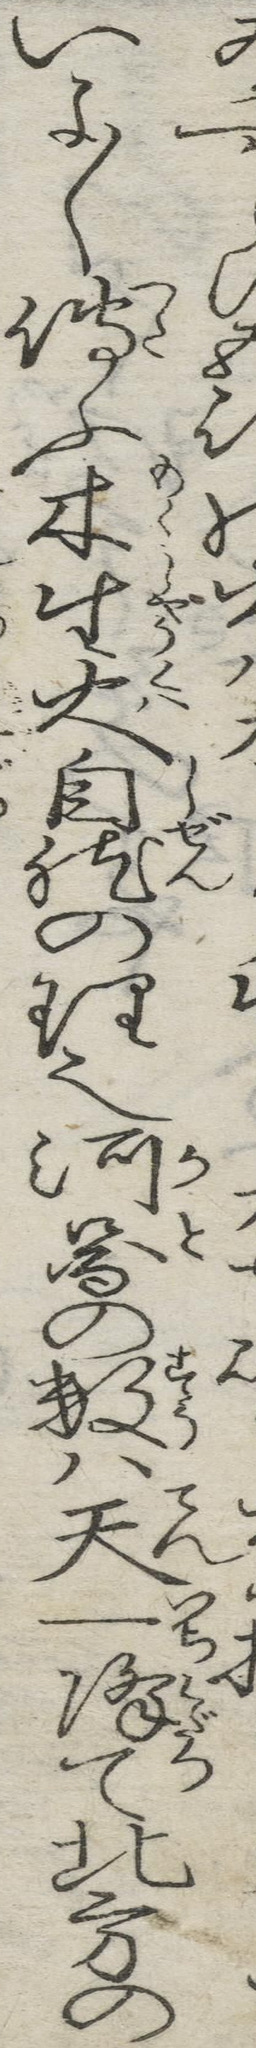いよ〳〵伝ふ木生火自然の理也河圖の数は天一降て北方の
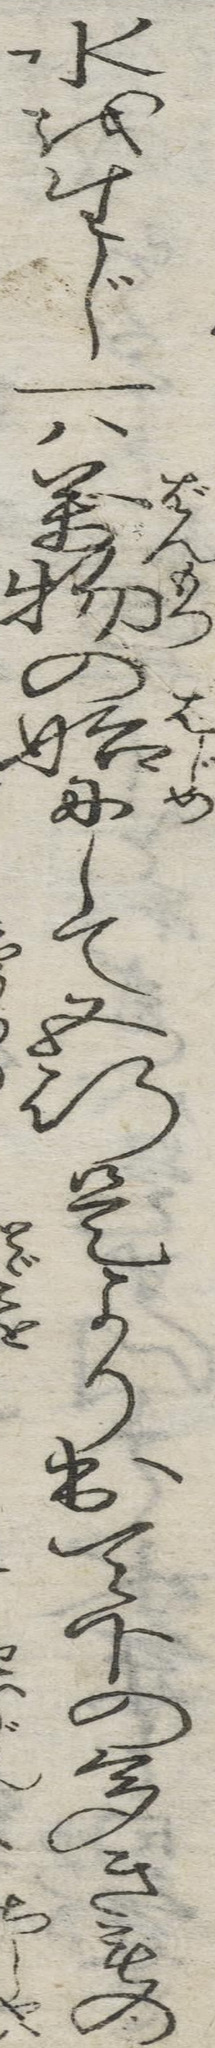水を生じ一は萬物の始にして五行是より出天下の多きもの
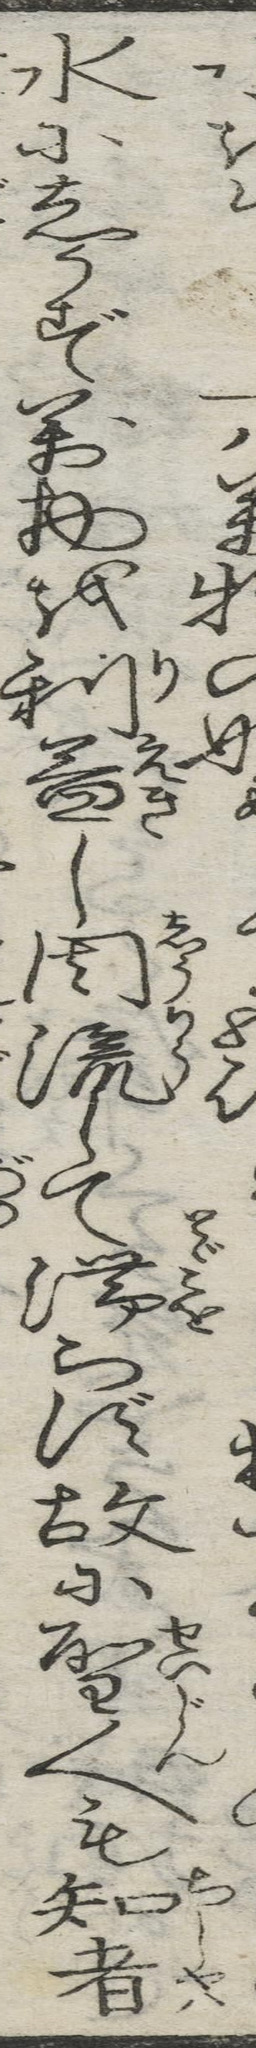水にしかず萬物を利益し周流して滞らず故に聖人も知者
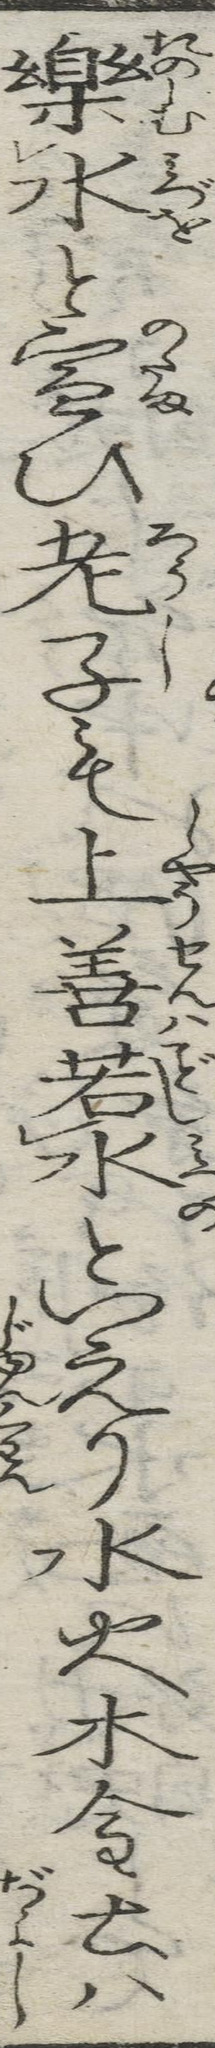楽水と宣ひ老子も上善若水といえり水火木金土は
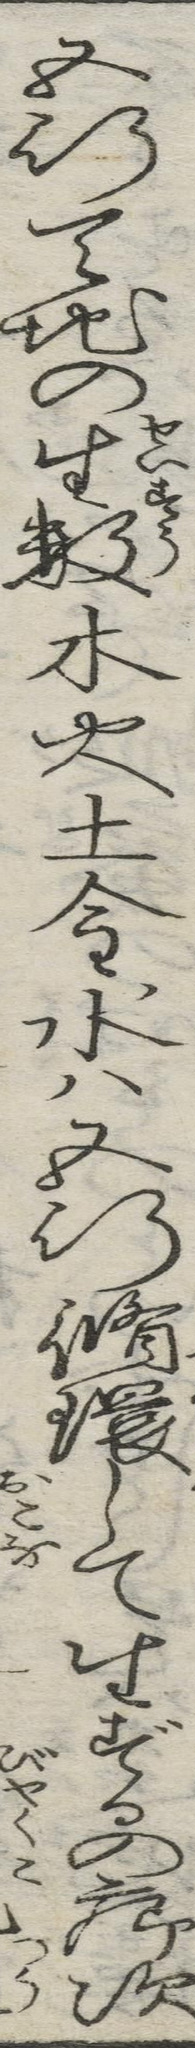五行天地の生数木火土金水は五行循環して生ずるの序次
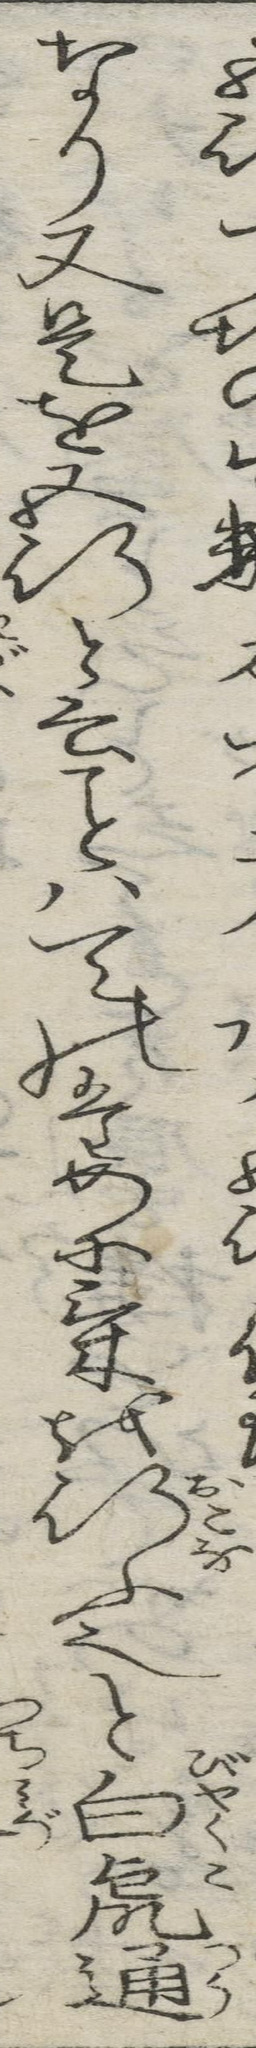なり又是を五行と云ことは天のために気を行ふと白虎通
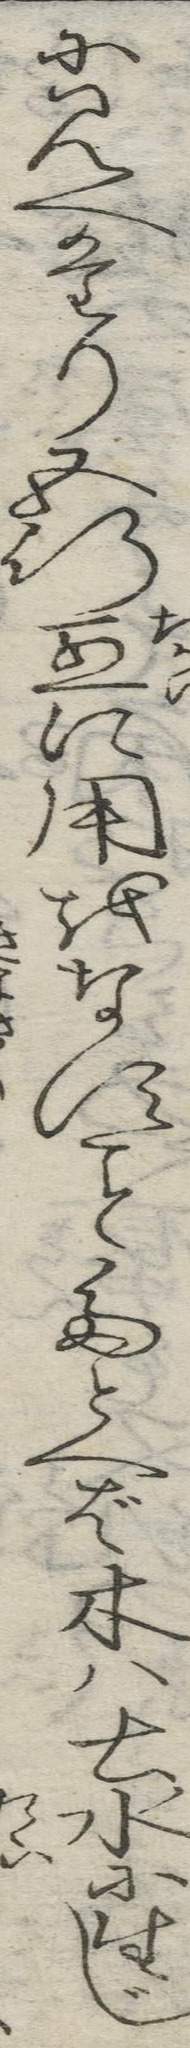に見へたり五行互に用をなすことたとへば木は土水に生じ
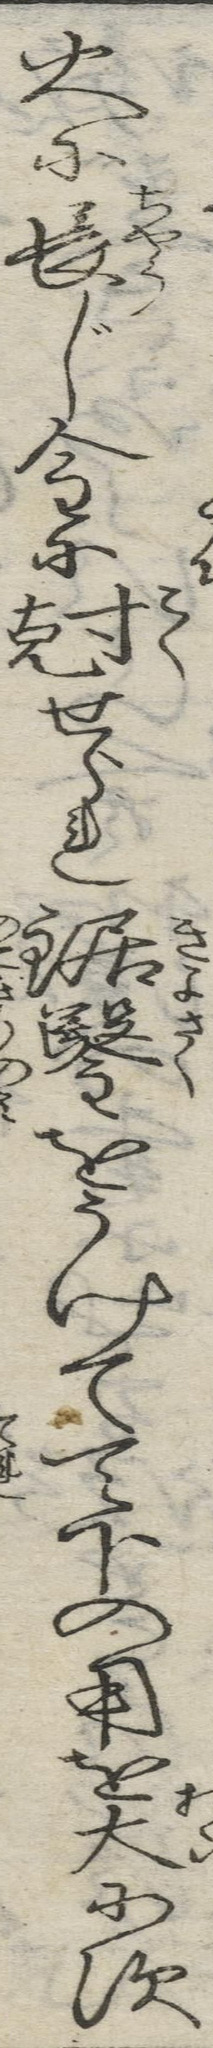火に長じ金に尅せられ鋸鑿をうけて天下の用を大にす
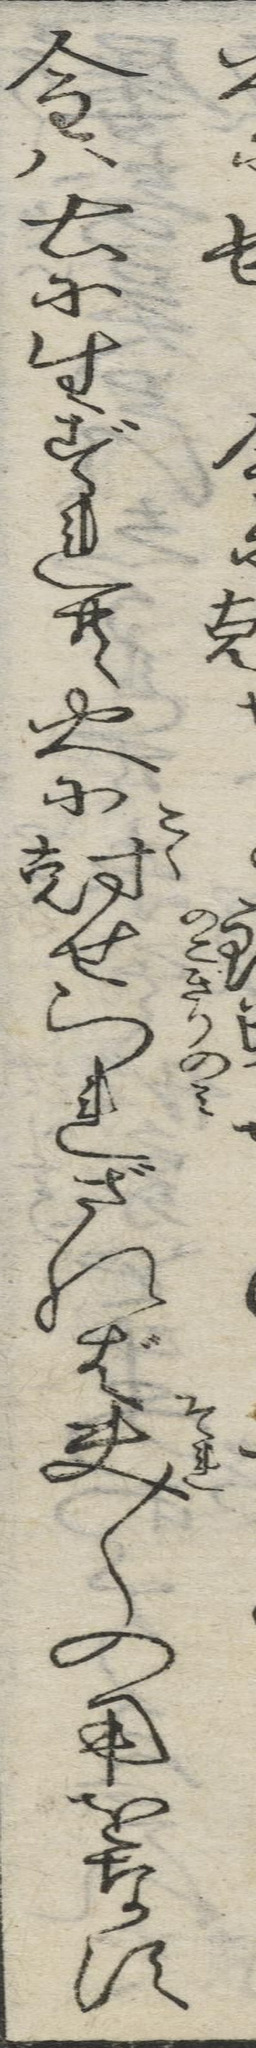金は土に生ずれども火に尅せられざれば夫〳〵の用をなず
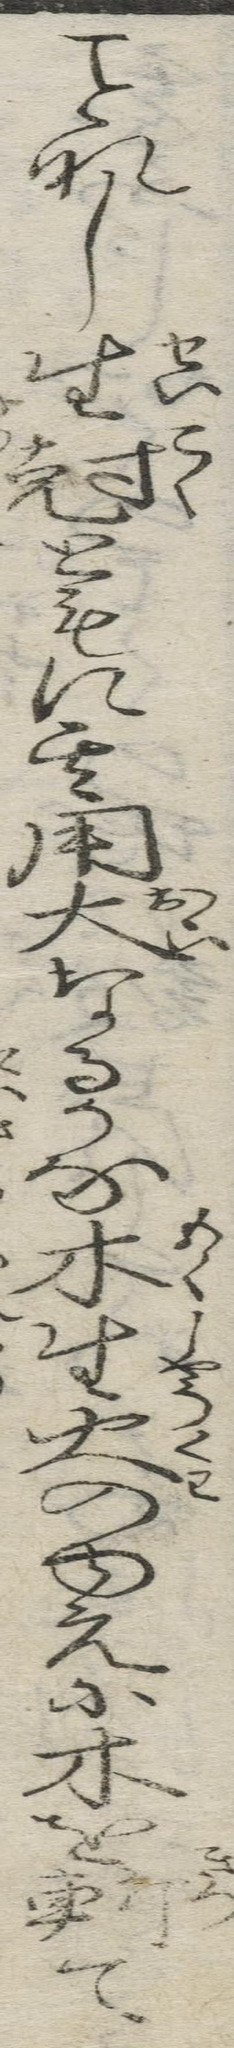ことなし生尅ともに其用大なるかな木生火のゆへに木を斬て
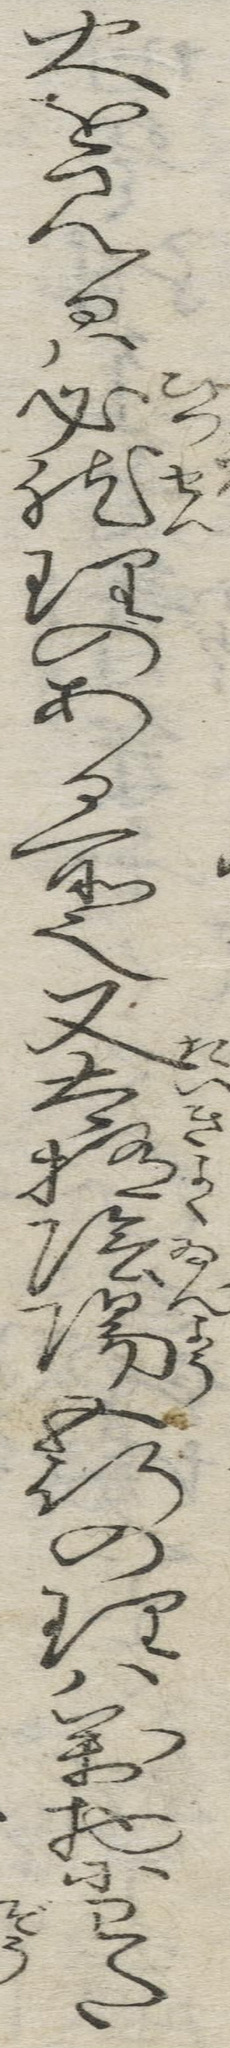火を見るは必然理のある所也又太極陰陽五行の理は萬物にわた
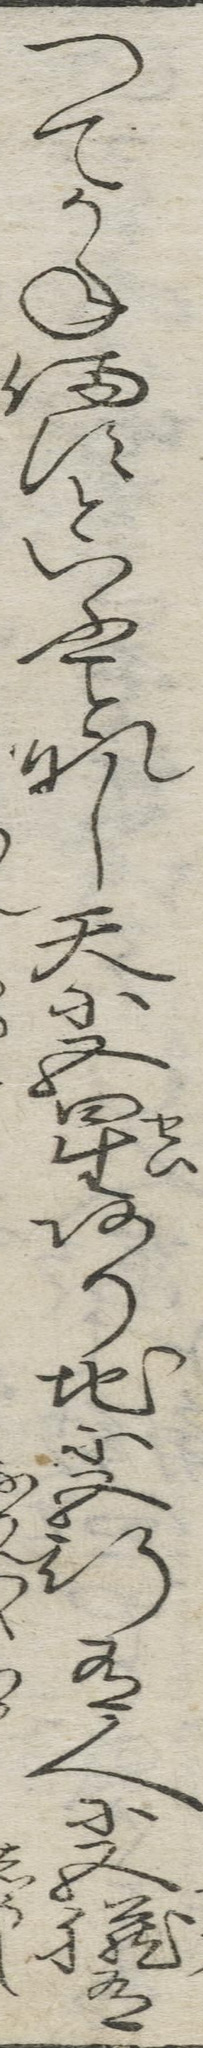つてかねさすといふことなし天に五星あり地に五行有人に五臓有
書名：訓蒙天地辨　地
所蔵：東京大学地震研究所図書室 Earthquake Research Institute Library, The University of Tokyo, JAPAN
